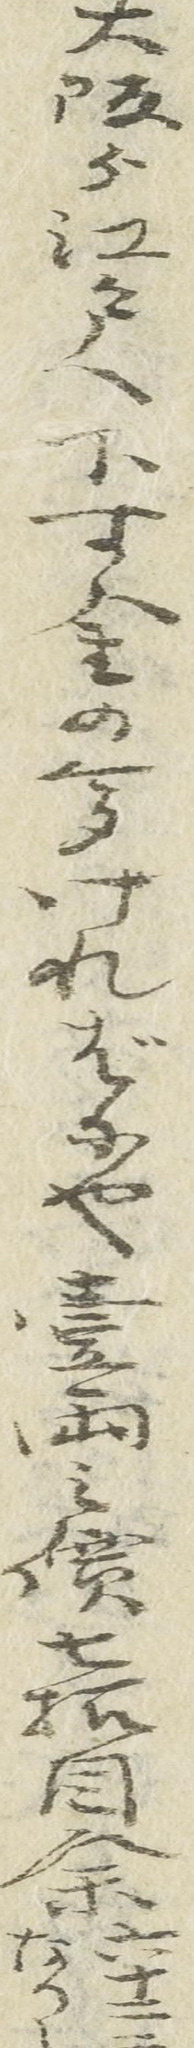大阪より江戸へ下す金の多ければにや壱両之價七拾目余六十二三匁なりしを
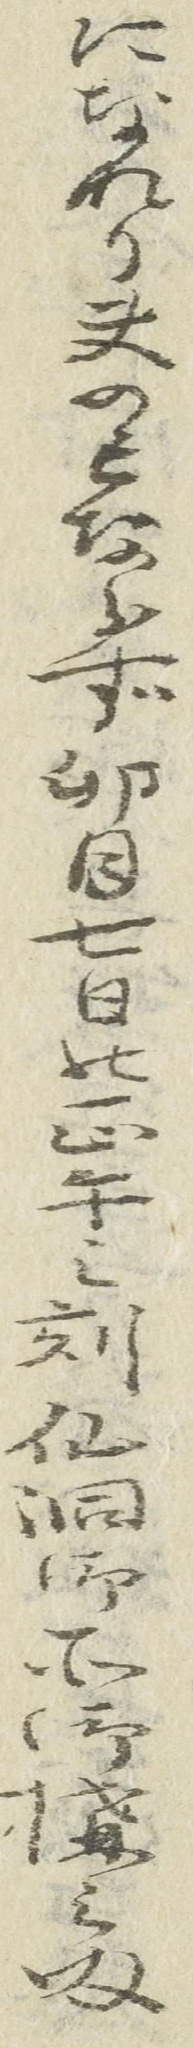になれり夫のみならず卯月七日の正午の刻仙洞御所御構之内
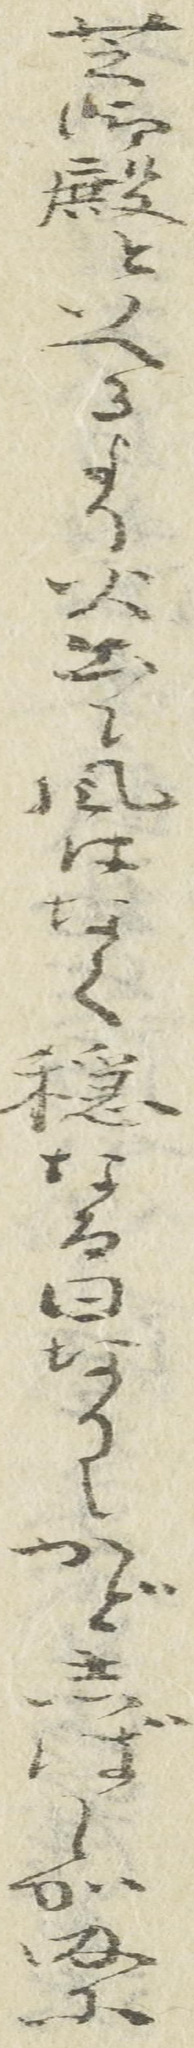芝御殿といへるより火出て風はなく穏なる日なりしかどしばしが内に
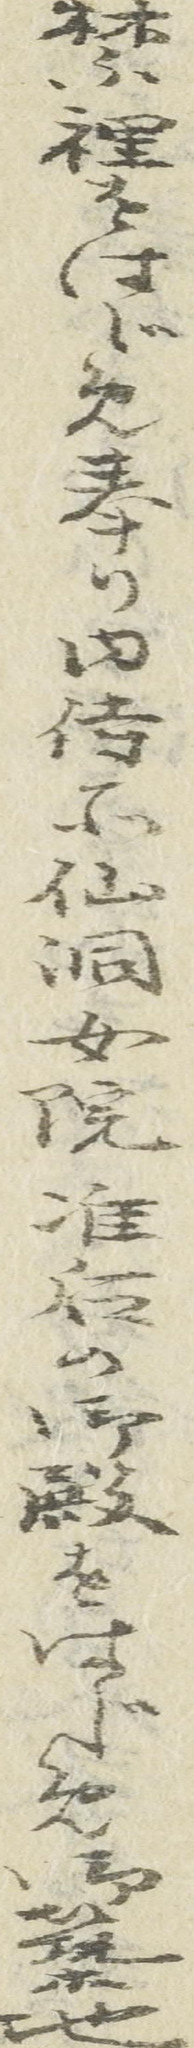禁裡をはじめ奉り内侍所仙洞女院准后の御殿をはじめ御築地
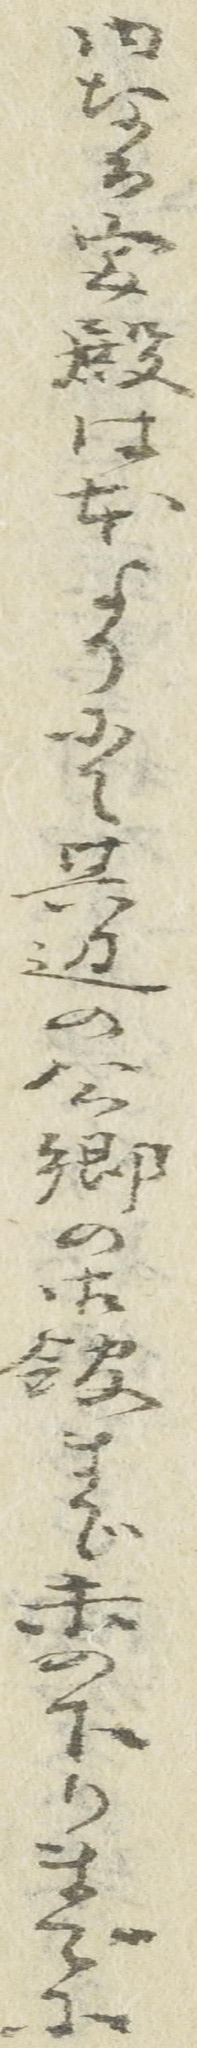内なる安殿は本よりにて其辺の公卿の御館まで未の下りまでに
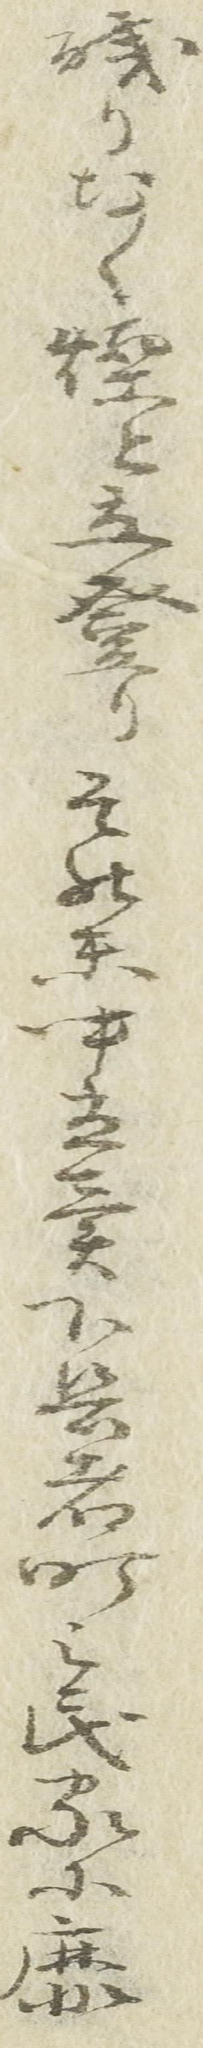残りなく煙と立登りその末中立売下長者町之氏家に靡
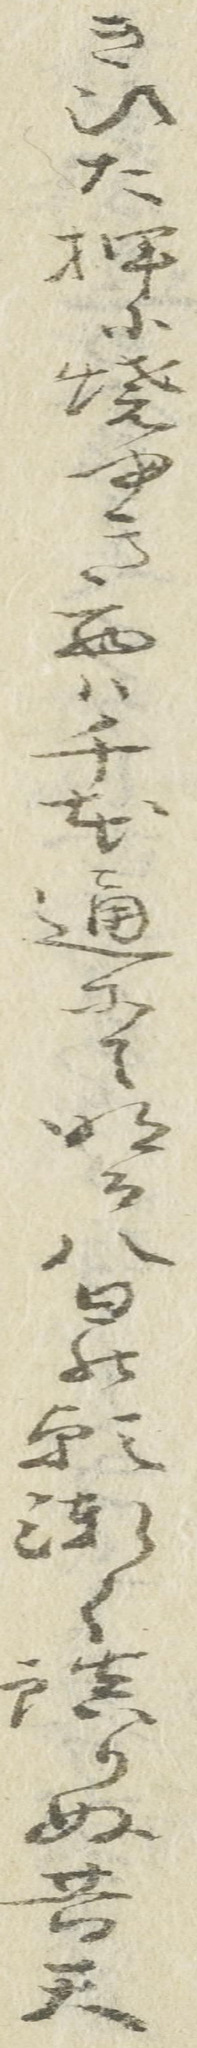きひた押に焼ゆき西ハ千本通にて明る八日の朝漸く鎮まりぬ昔天
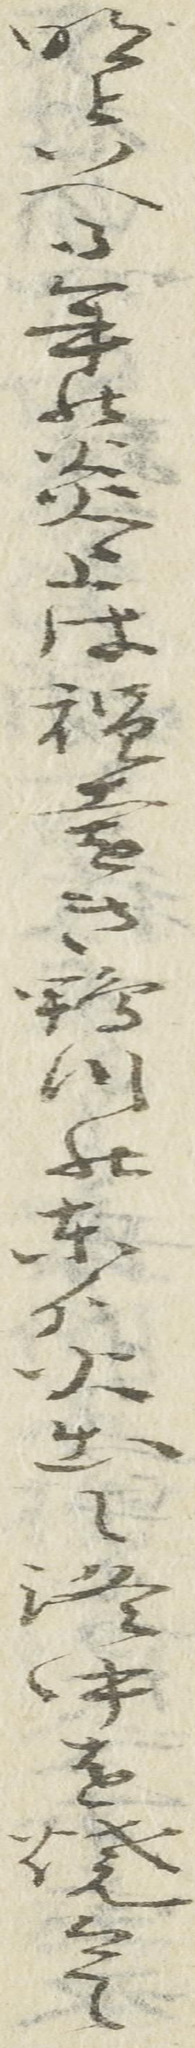明といへる年の炎上は程土遠き鴨川の東ゟ火出し洛中を焼いて
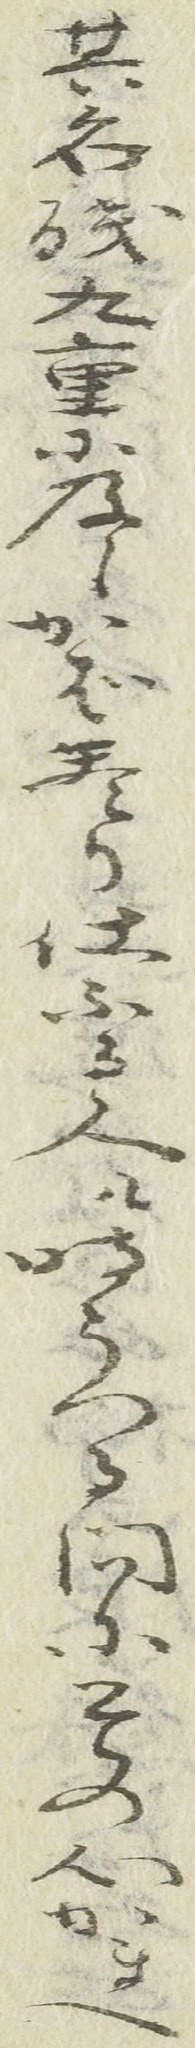其名残九重に及しかば奉り仕ふる人も時うつる間にその心かまへ
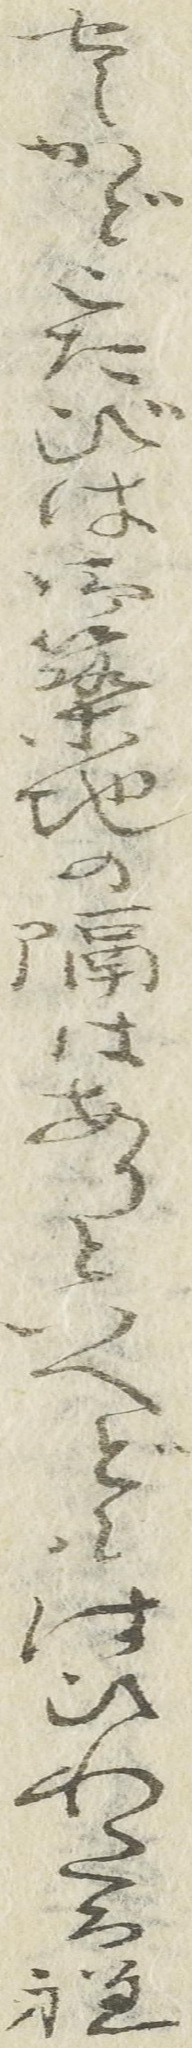セしかどこたびは御築地の隔はありといへどもはひわたる程
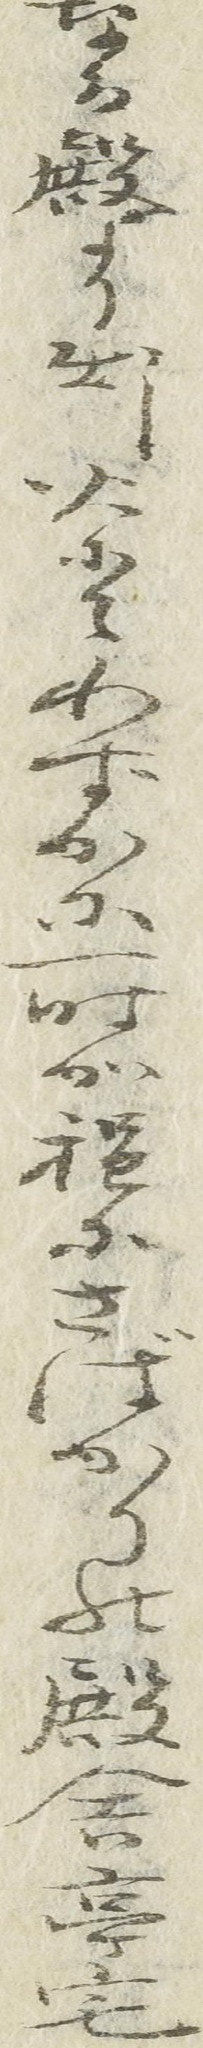なる殿より出し火にてわずかに一時が程にさばかりの殿舎亭宅
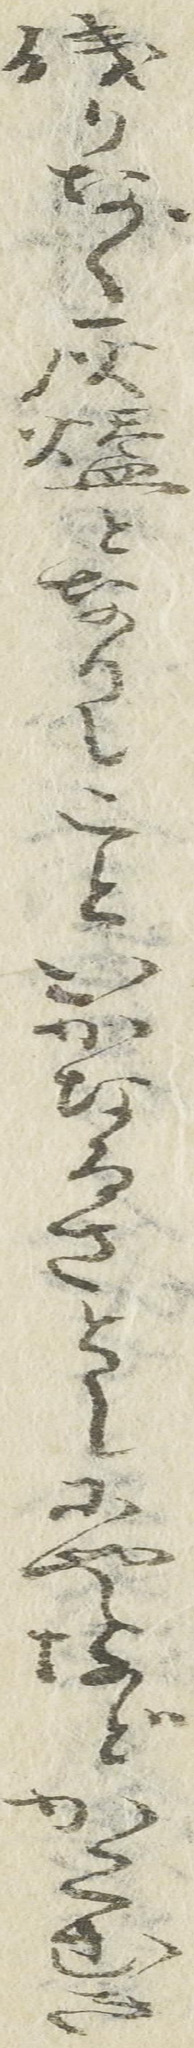残りなく灰燼となりしこといかなるさとしにやなどかたむき
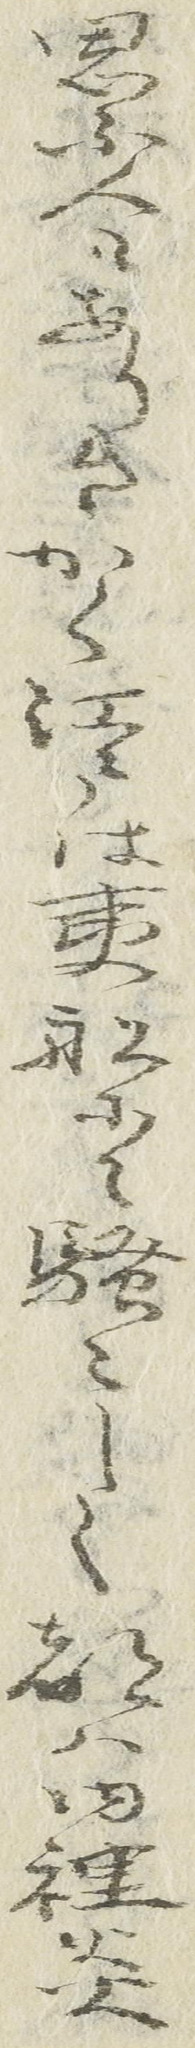思ふ人もありきかく江戸は夷船にて騒々しく都ハ内裡炎
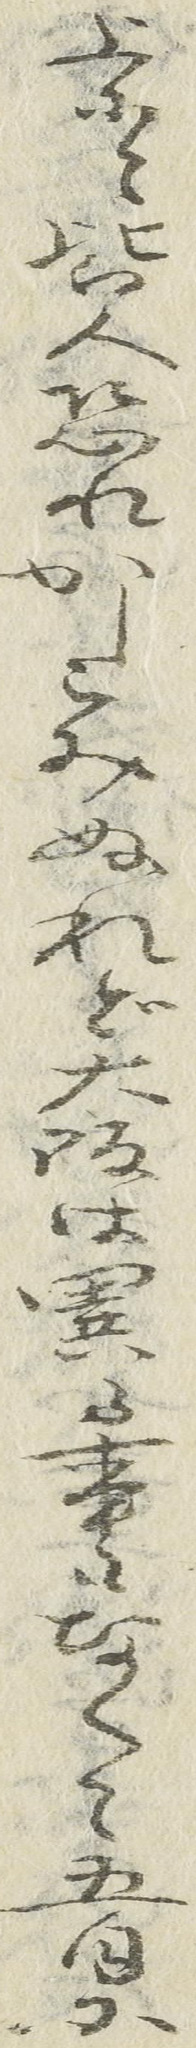上にて皆人恐れかしこみぬれど大阪は異る事もなくて五月に
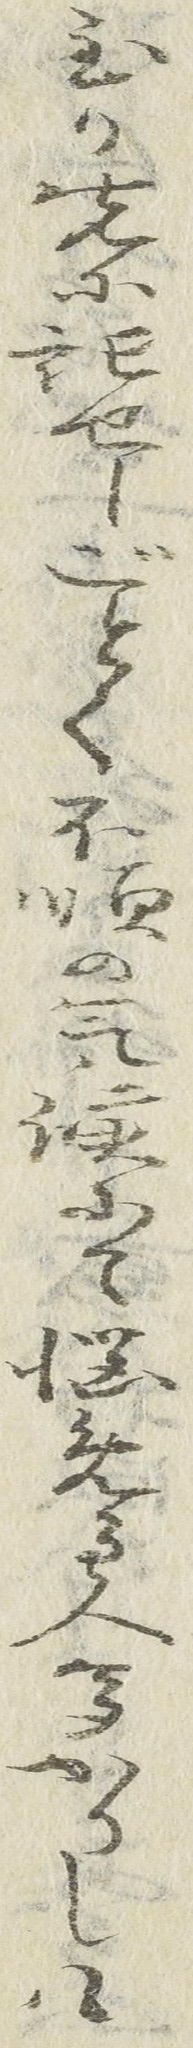至り先に記セしごとく不順の気候にて悩める人多かりしも
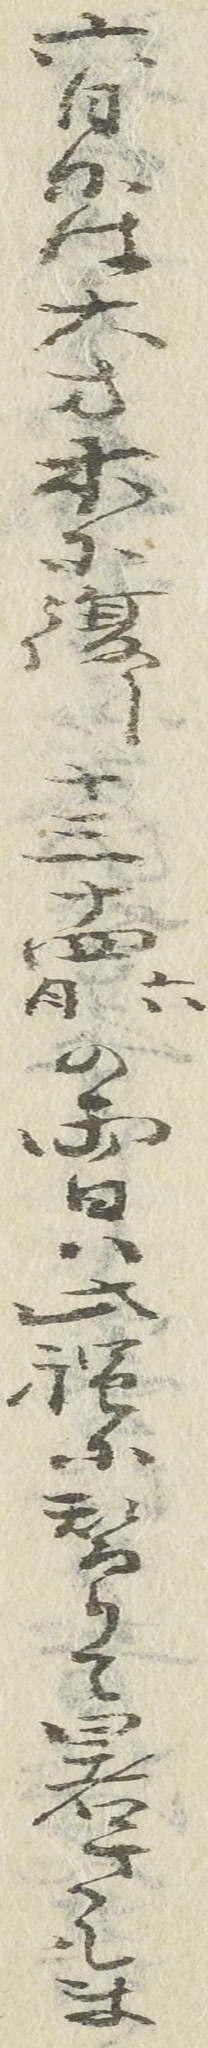六月には大方本に復し十三十四六月の両日ハ此程に替りて暑さもま
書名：地震前兆集　全
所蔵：東京大学地震研究所図書室 Earthquake Research Institute Library, The University of Tokyo, JAPAN
